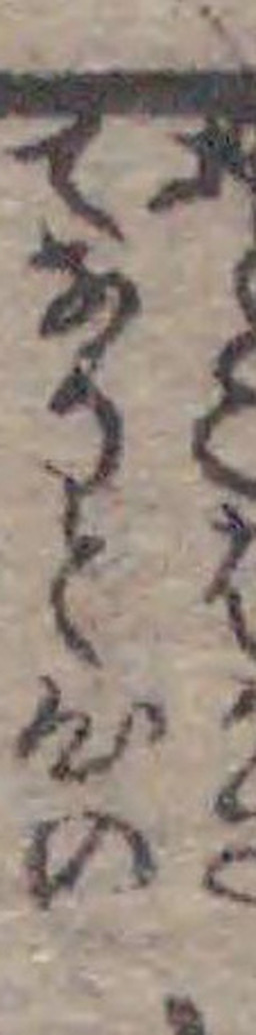てなりと心の
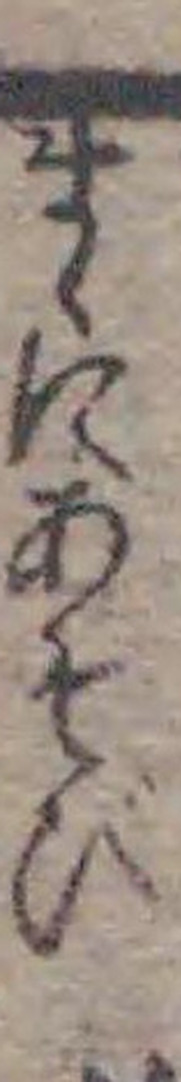まゝにあそび
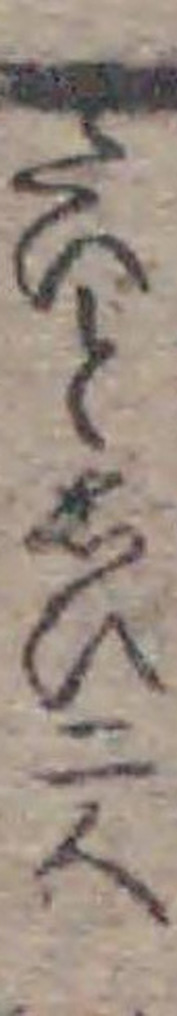たいと思ひ二人
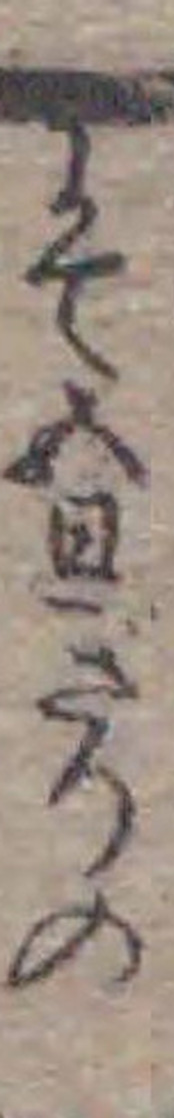にて五日ぎりの
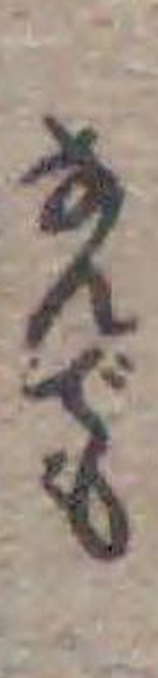なんでも
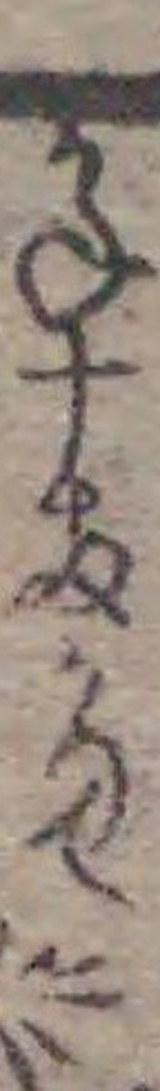かね十両かりて
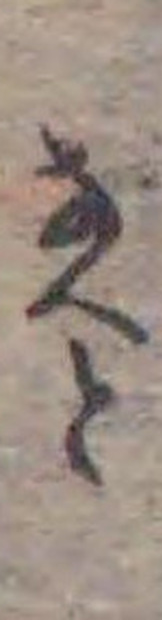なへと
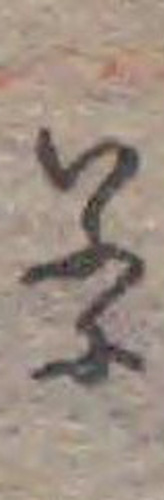いふに
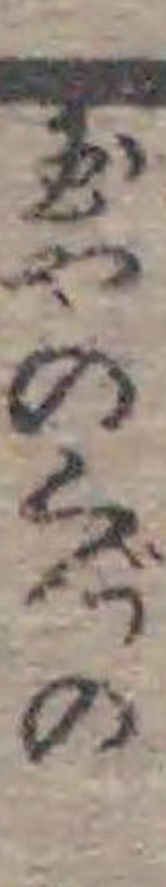玉やのくづの
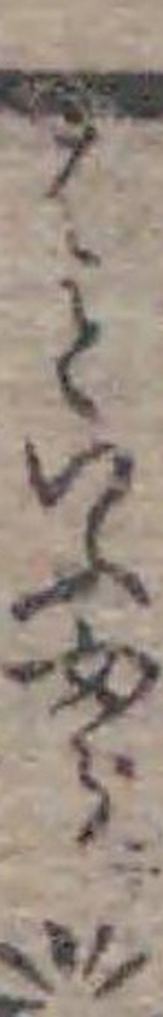はといふ女郎て
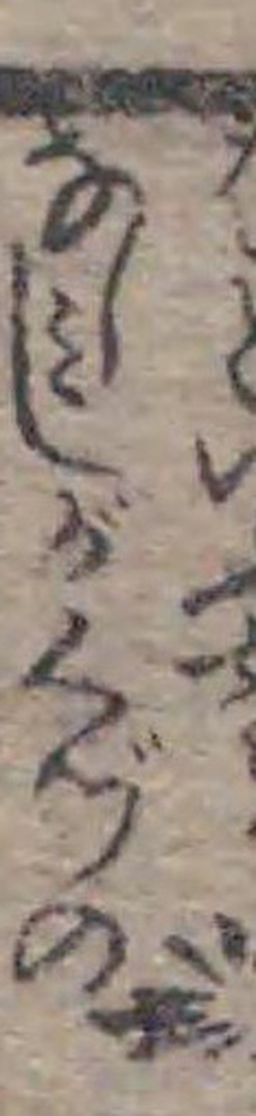なしみしがくづの
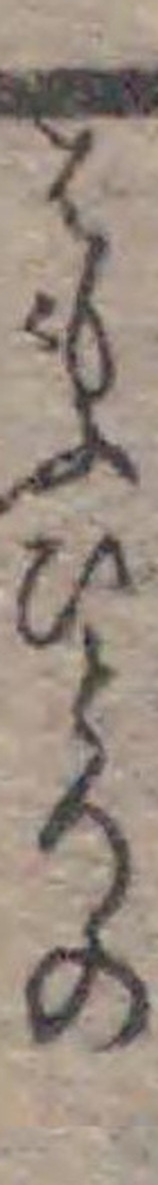はもふひとりの
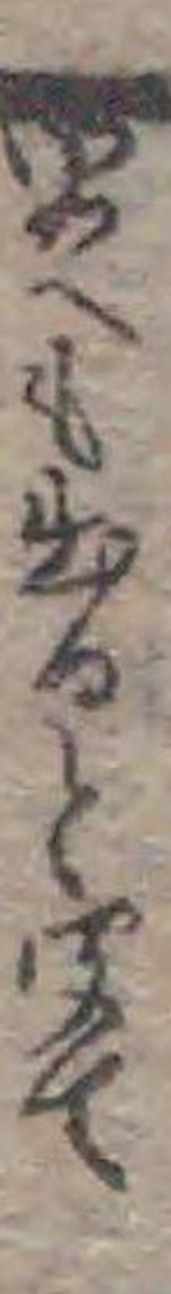男へも出ると聞て
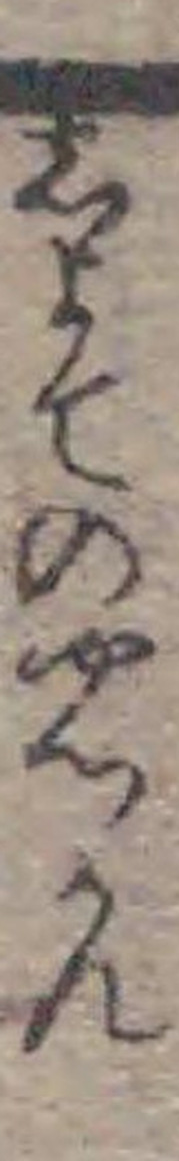しよてのやつかん
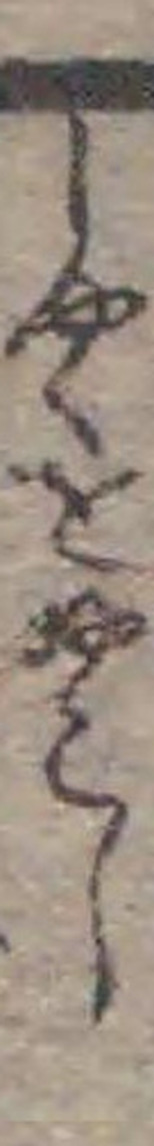しやくをおこし
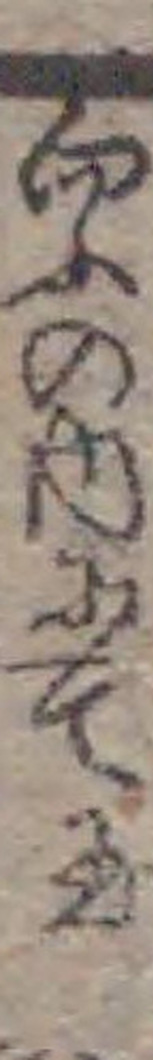向ふの内にて玉
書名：紺屋百物語 : 3巻
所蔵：国立国会図書館 National Diet Library, JAPAN
